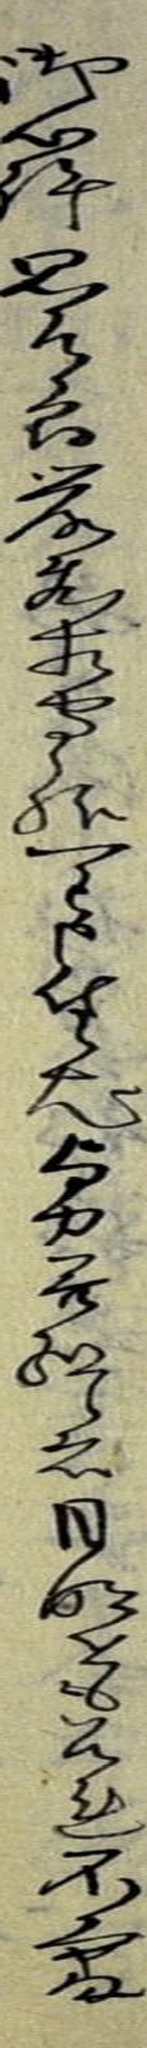御心許思召候間厳敷相守候様可被申付候尤与力并組之者目明とも召連不審
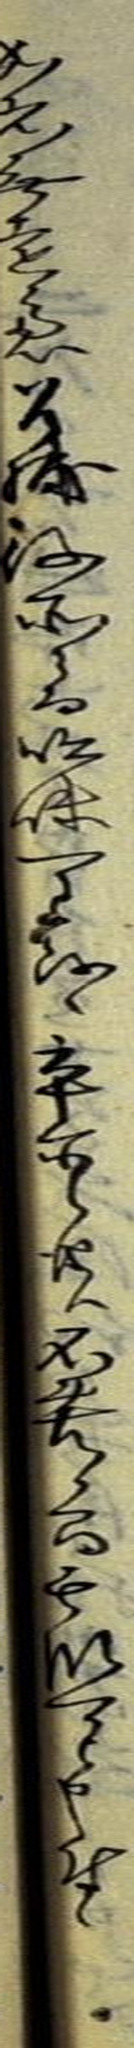成者無遠慮召捕役所ニ而吟味可被致候卒爾之儀ハ不苦候間其段可被申付候
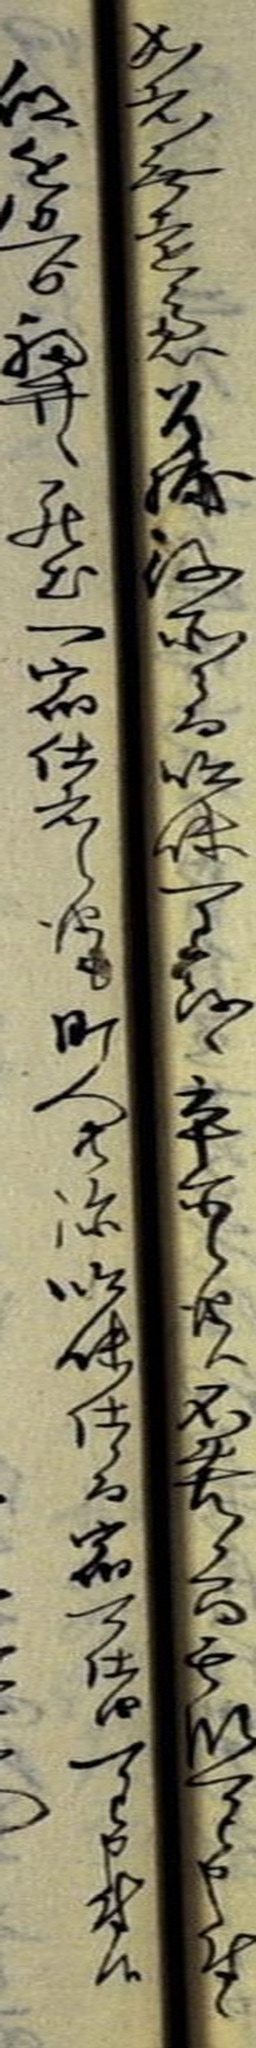但近辺ゟ福井へ罷出一宿仕者之儀も町人共弥吟味仕候間宿可仕由可被申付候
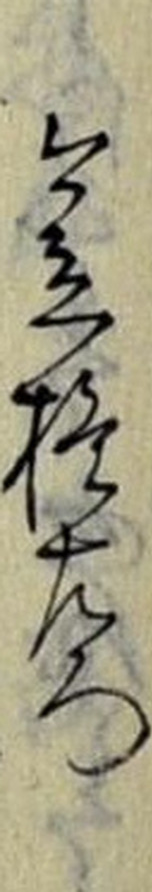今立権左衛門
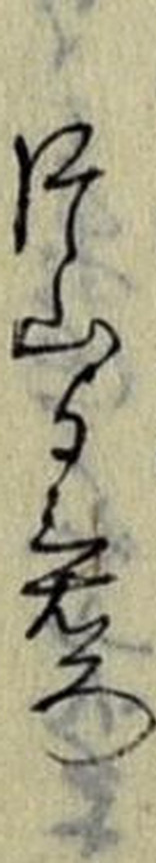片山与三右衛門
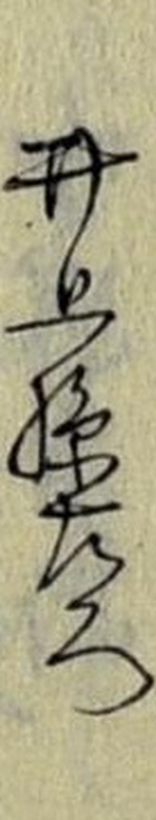覚井上孫左衛門
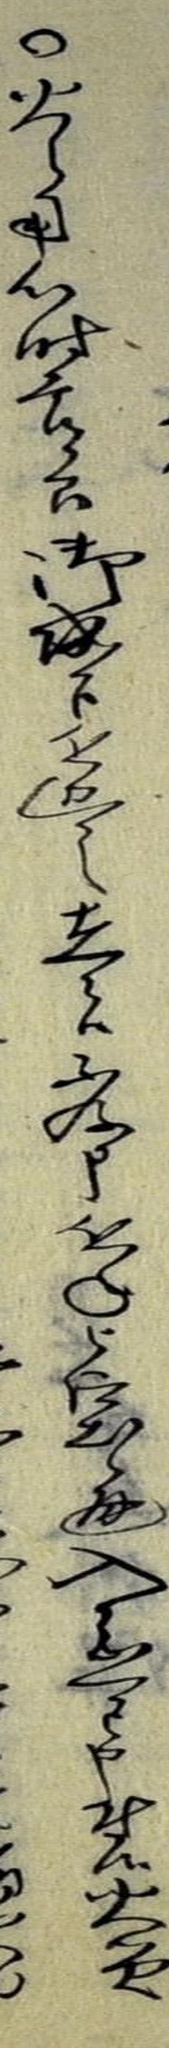〇火之用心時節候間御城下近辺之在々ハ不及申近年被仰出候通入念可被申付候火災
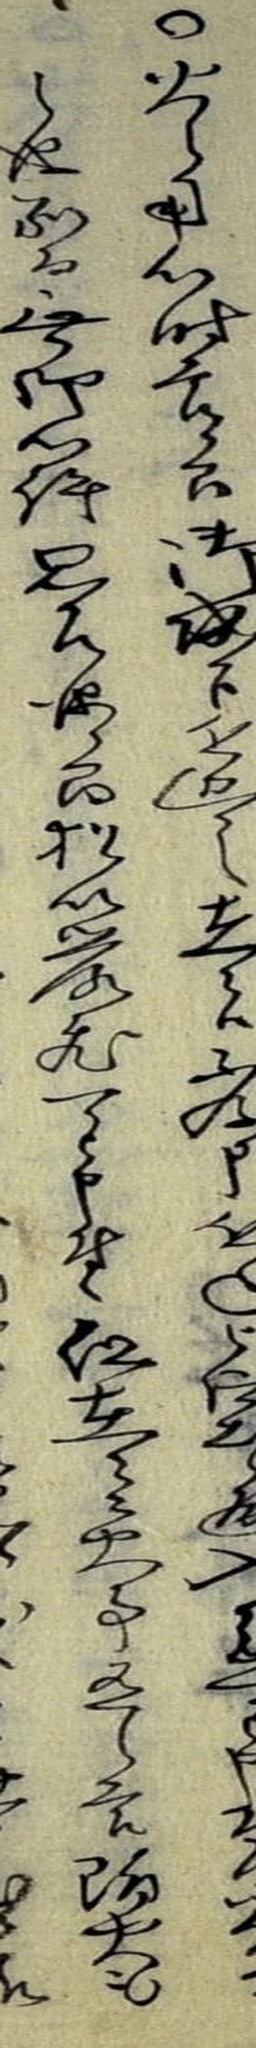之儀別而無御心許思召儀候間猶以厳敷可被申付候但在々ニ火事有之節付火も
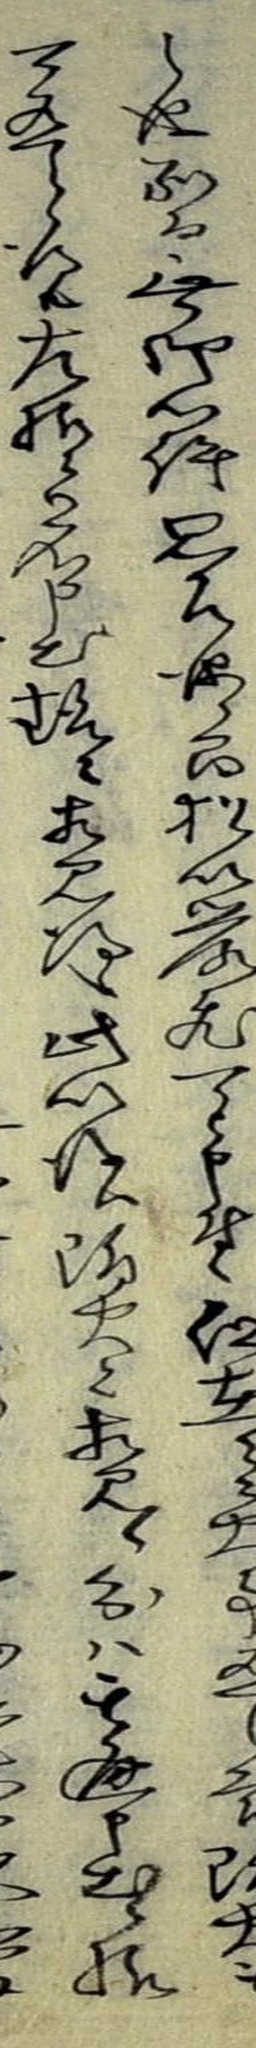可有之候得共左様ニハ不申出趣ニ相見得候此以後ハ付火と相見候分ハ其通申出候様
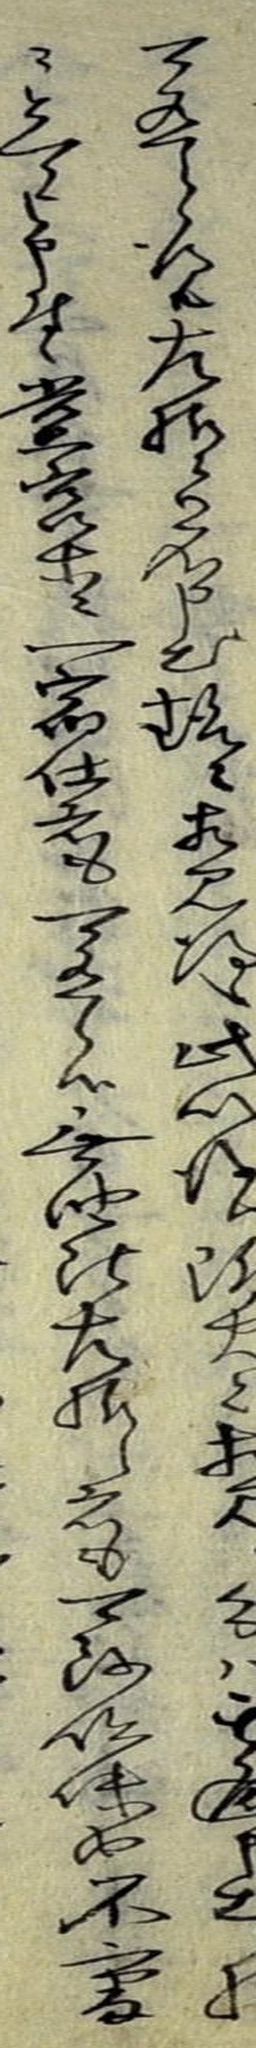ニと可被申付候堂宮等ニ一宿仕者も可有之候無油断左様之者も可致吟味由不審
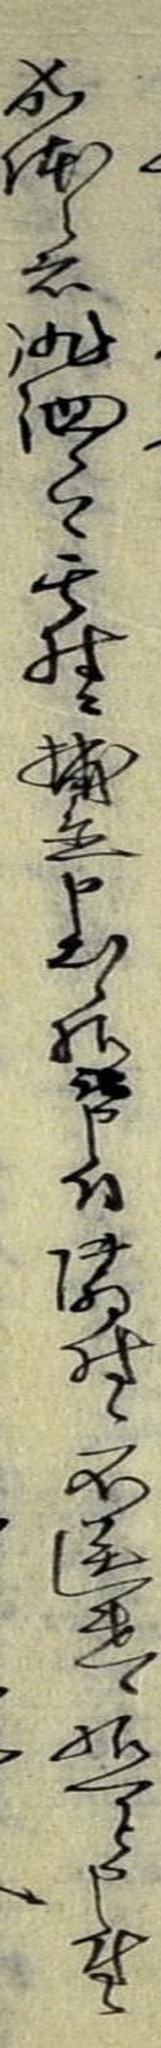成体之者徘徊候ハヽ其村ニ捕置申出候様被申付隣村へ不送遣候様可被申付候
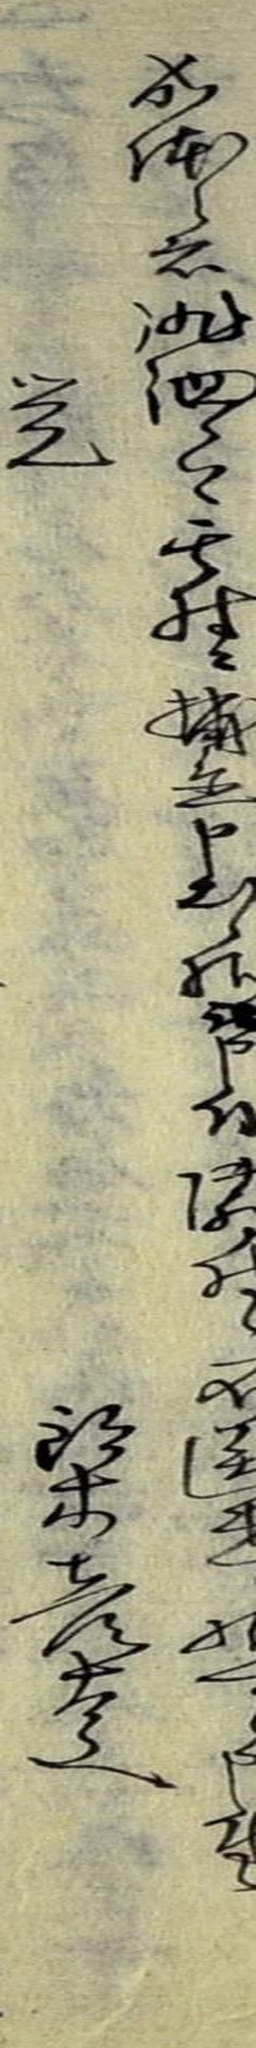覚鈴木彦大夫
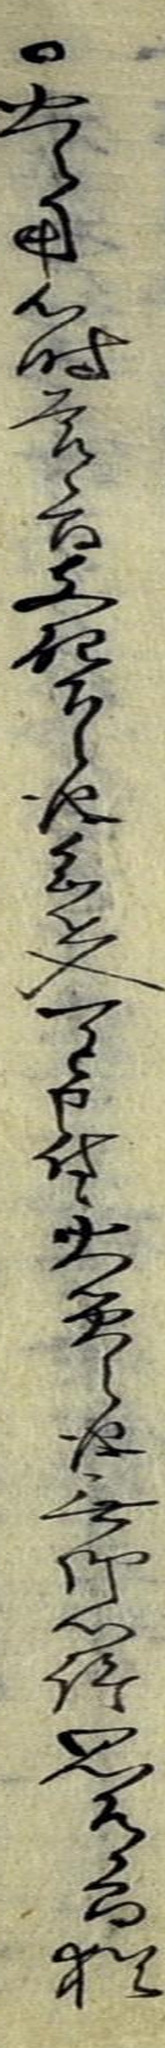〇火之用心時節候間支配下之儀念を入可被申付候火災之儀無御心許思召候間猶
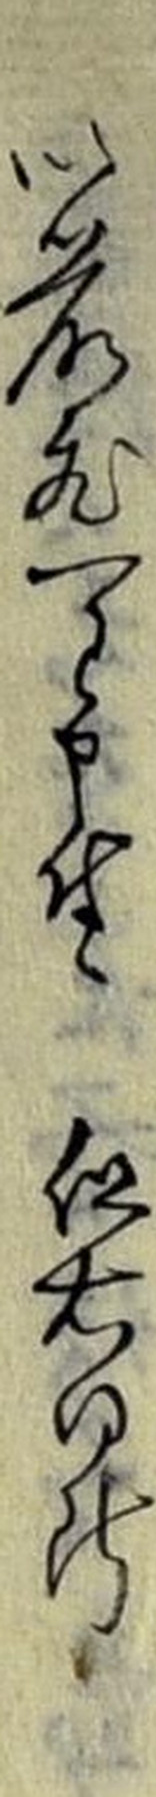以厳敷可被申付候但右同断
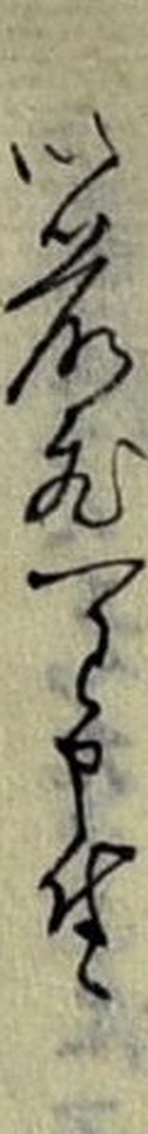念を入可被申付候
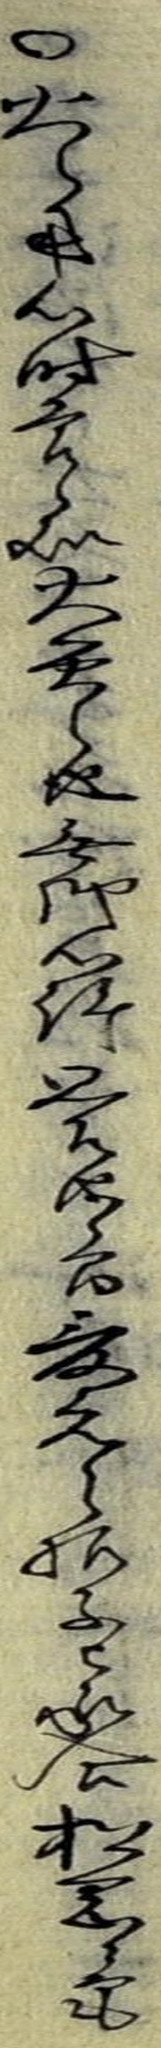〇火之用心時節候処火災之儀無御心許思召儀候間爰元様子被承合松岡ニ而も
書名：命令之部 一
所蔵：福井県文書館 Fukui Prefectural Archives
